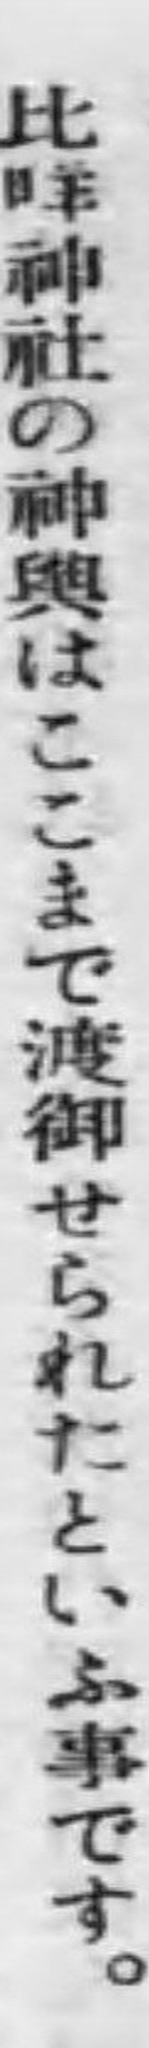比咩神社の神輿はここまで渡御せられたといふ事です。
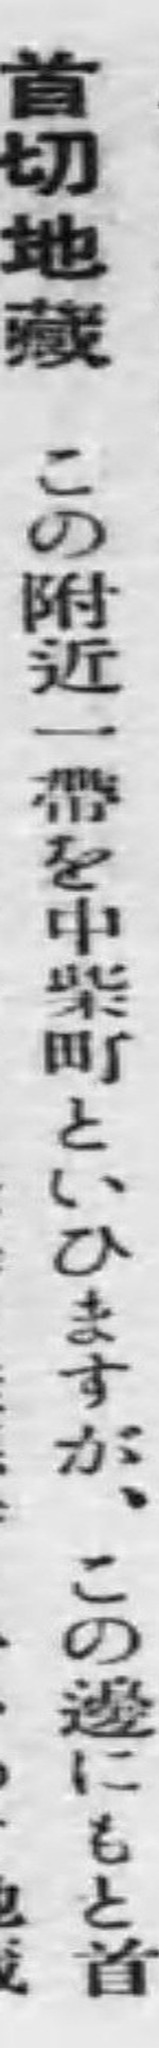首切地蔵この附近一帯を中柴町といひますが、この辺にもと首
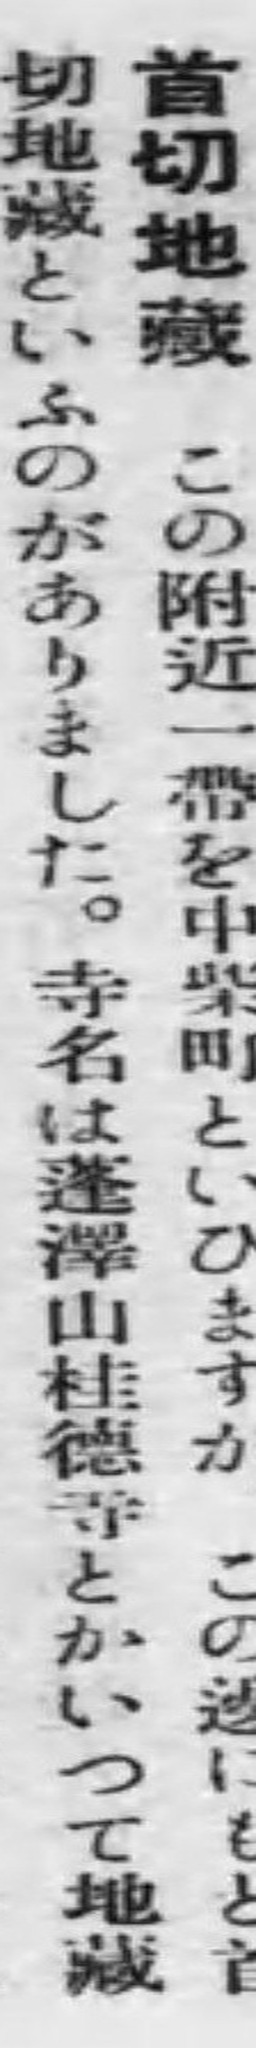切地蔵といふのがありました。寺名は蓬沢山桂徳寺とかいつて地蔵
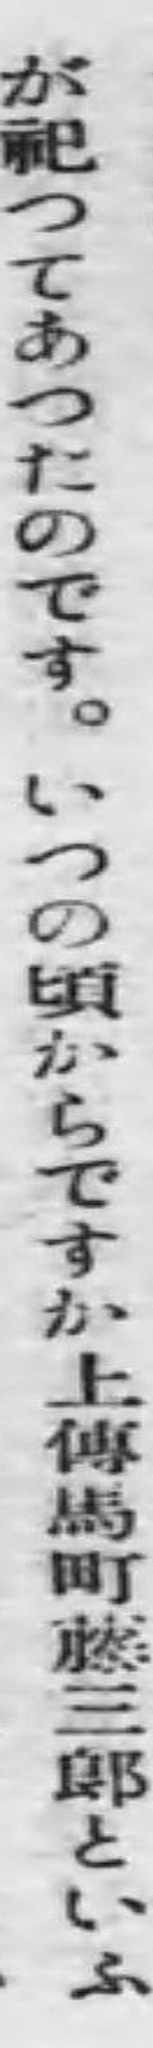が祀つてあつたのです。いつの頃からですか上伝馬町藤三郎といふ
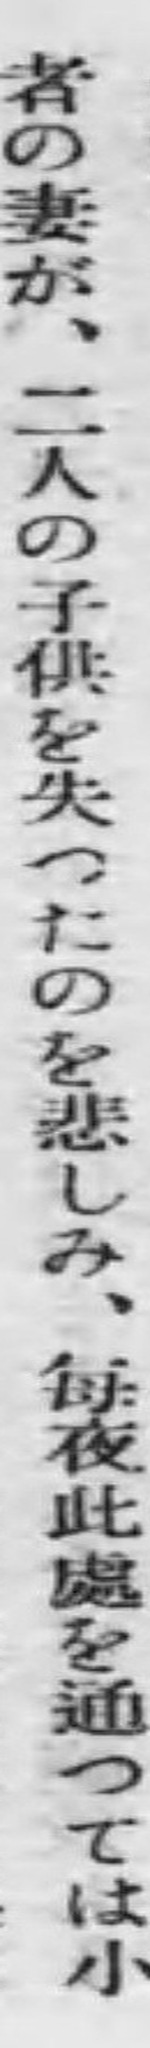者の妻が、二人の子供を失つたのを悲しみ、毎夜此処を通つては小
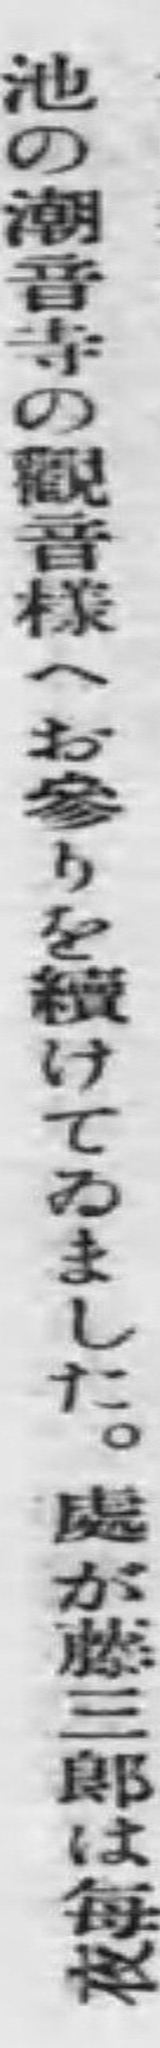池の潮音寺の観音様へお参りを続けてゐました。処が藤三郎は毎夜
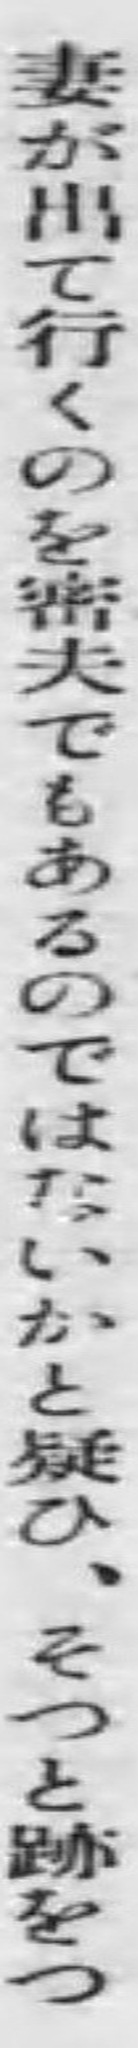妻が出て行くのを密夫でもあるのではないかと疑ひ、そつと跡をつ
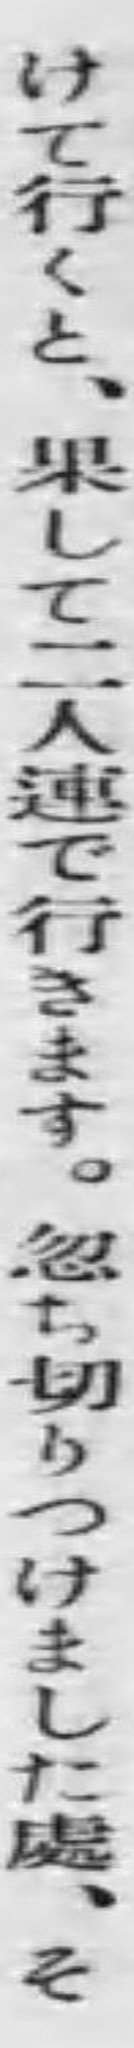けて行くと、果して二人連で行きます。忽ち切りつけました処、そ
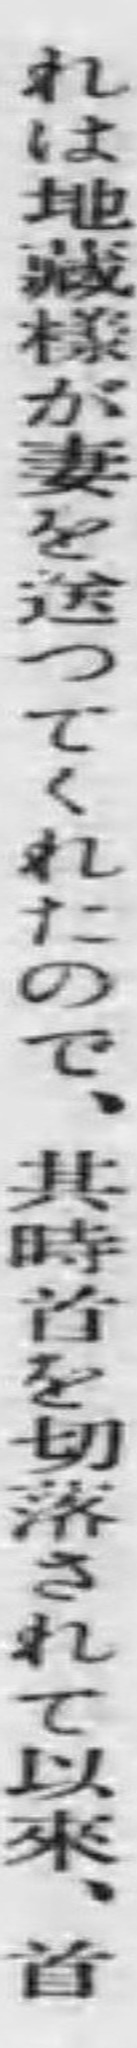れは地蔵様が妻を送つてくれたので、其時首を切落されて以来、首
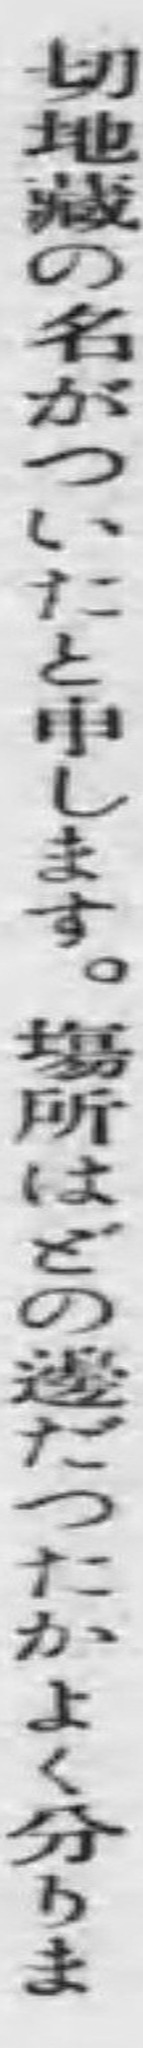切地蔵の名がついたと申します。場所はどの辺だつたかよく分りま
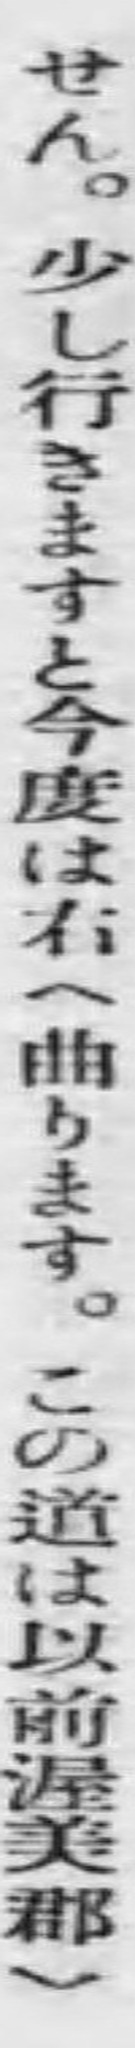せん。少し行きますと今度は右へ曲ります。この道は以前渥美郡へ
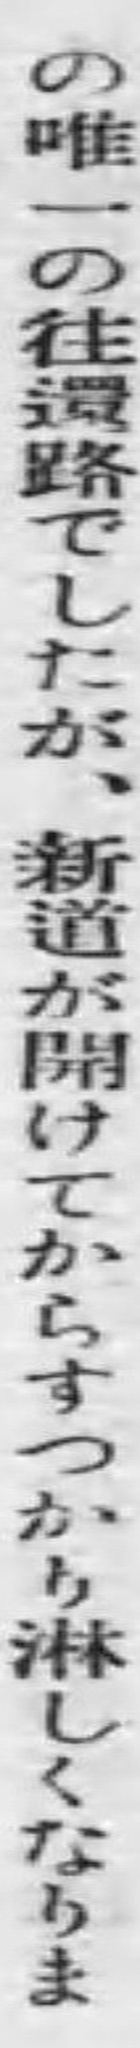の唯一の往還路でしたが、新道が開けてからすつかり淋しくなりま
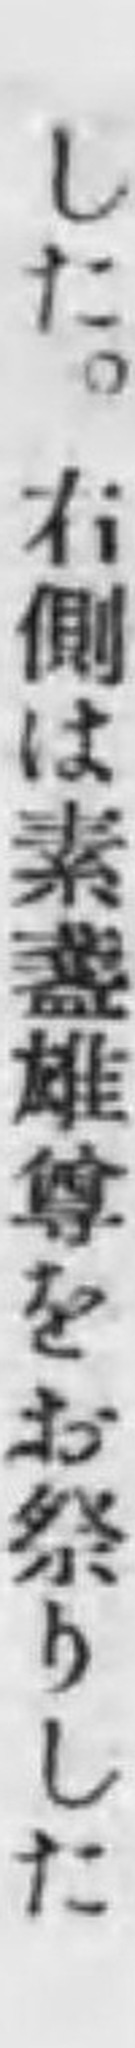した。右側は素盞雄尊をお祭りした
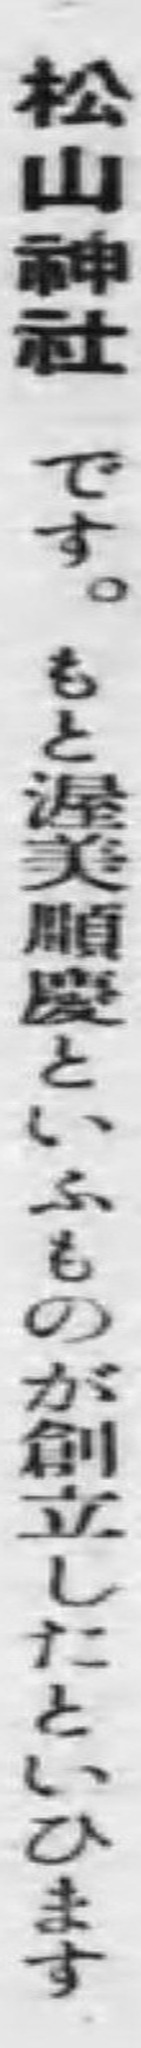松山神社です。もと渥美順慶といふものが創立したといひます
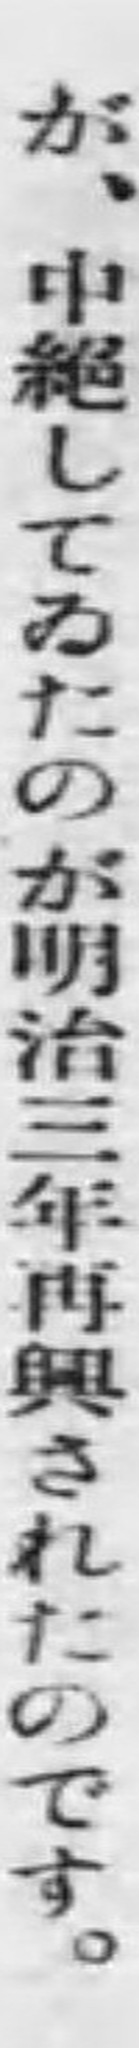が、中絶してゐたのが明治三年再興されたのです。
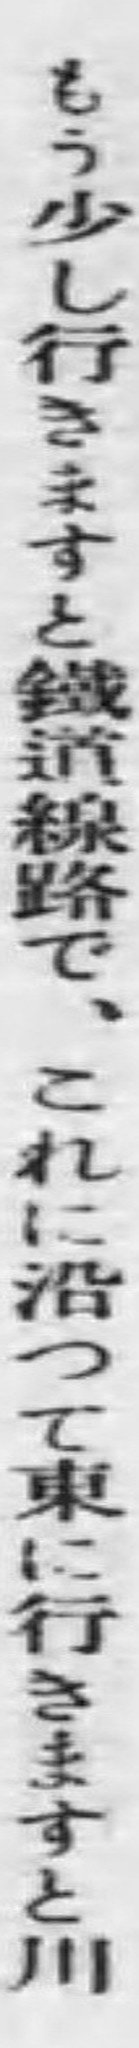もう少し行きますと鉄道線路で、これに沿つて東に行きますと川
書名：東三河道中記 : 豊橋市及其附近案内
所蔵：国立国会図書館 National Diet Library, JAPAN
